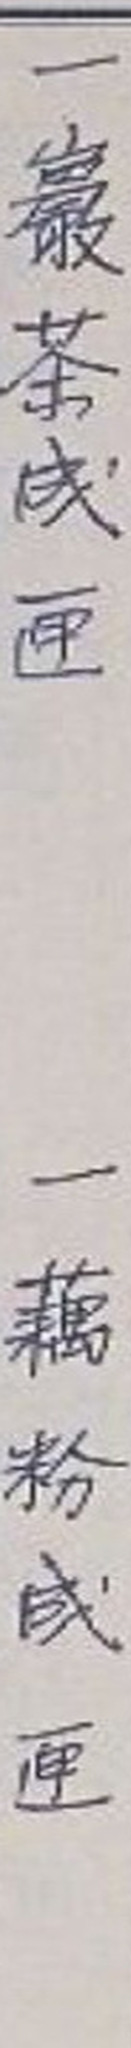一巖茶成匣一藕粉成匣
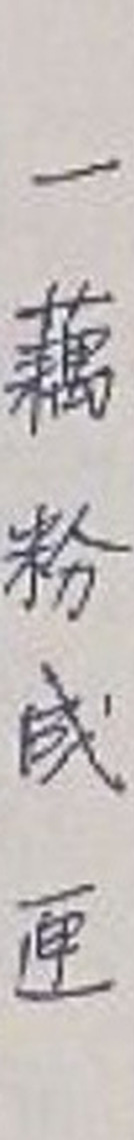一巖茶成匣一藕粉成匣
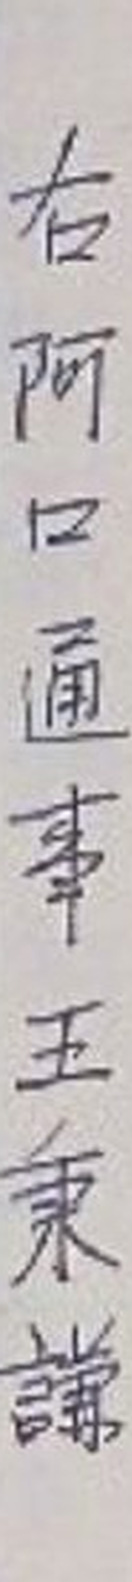右阿口通事王秉謙
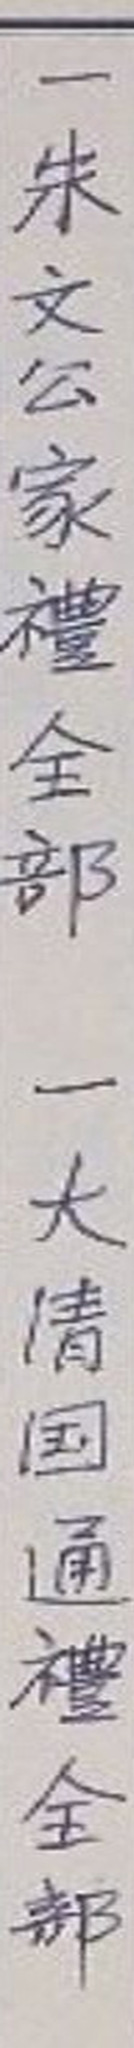一朱文公家礼全部一大清国通礼全部
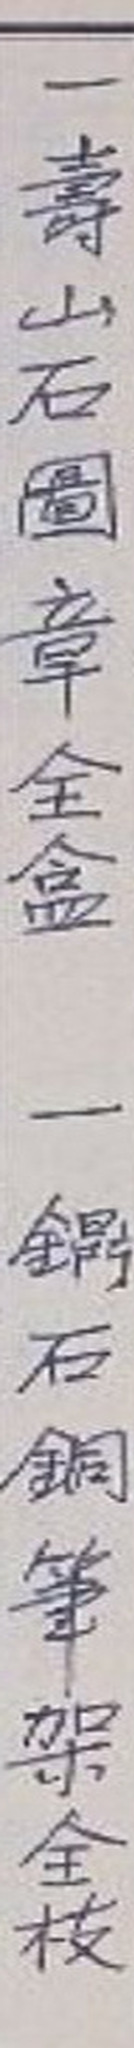一寿山石図章全盒一石銅筆架全枝
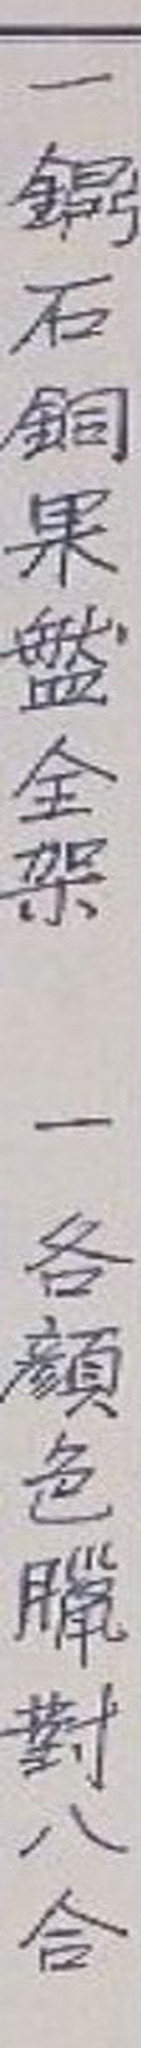一石銅果盤全架一各顔色臘対八合
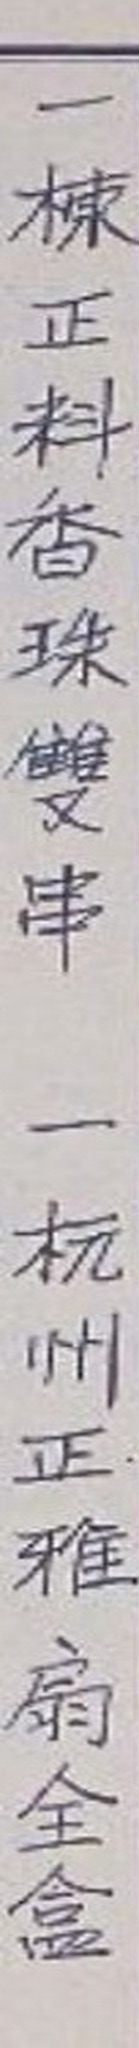一棟正料香珠雙串一杭州正雅扇全盒
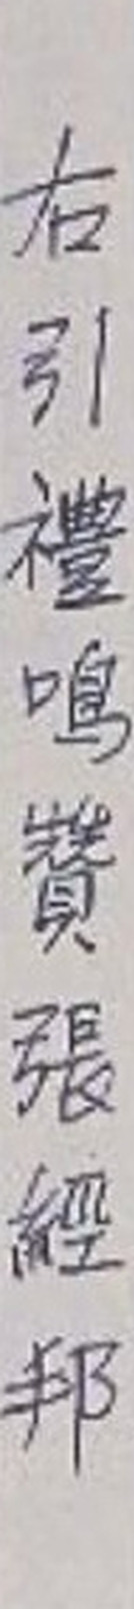右引礼鳴賛張経邦
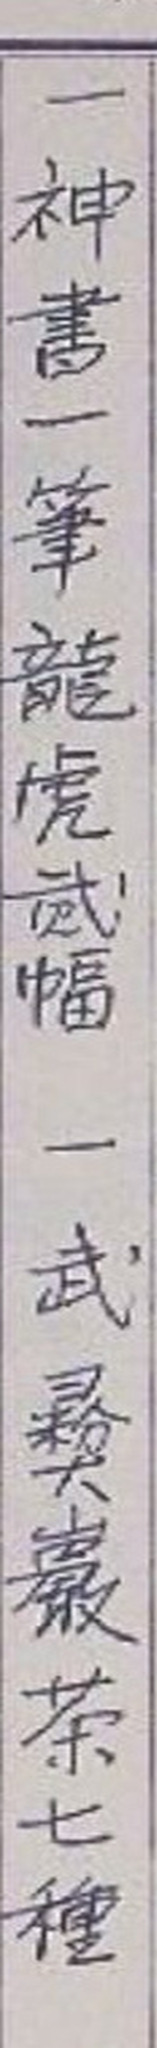一神書一筆竜虎弐幅一武彛巖茶七種
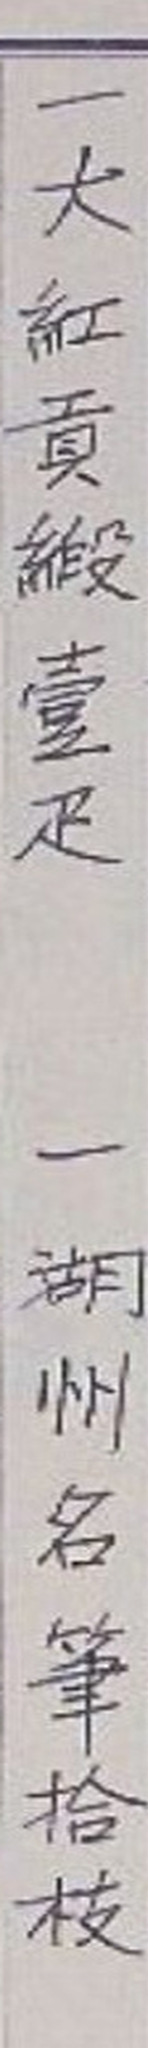一大紅貢緞壱疋一湖州名筆拾枝
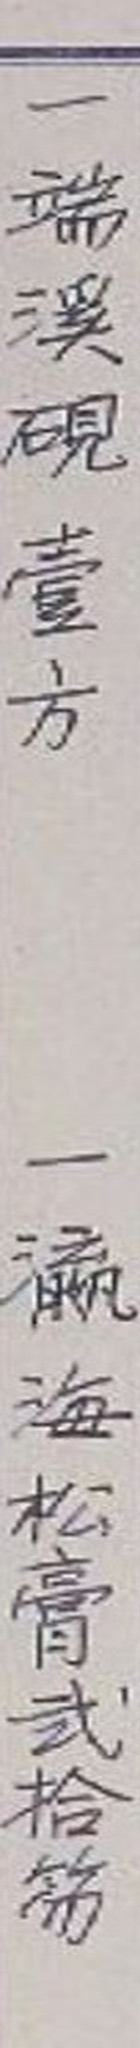一端渓硯壱方一瀛海松膏弐拾笏

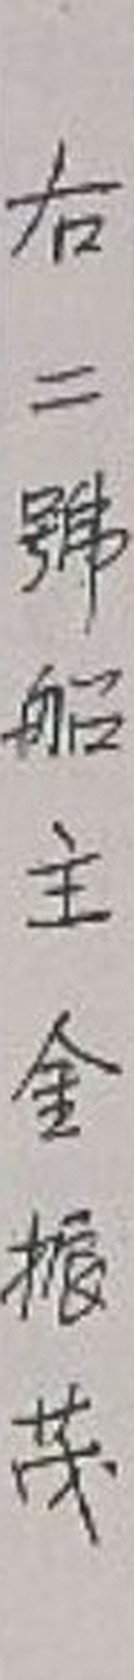右二号船主金振茂
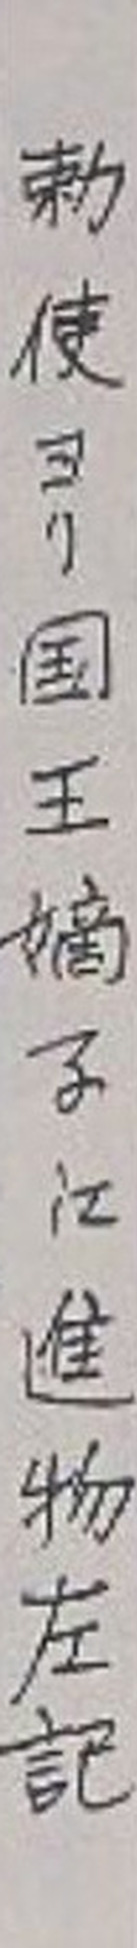勅使より国王嫡子え進物左記
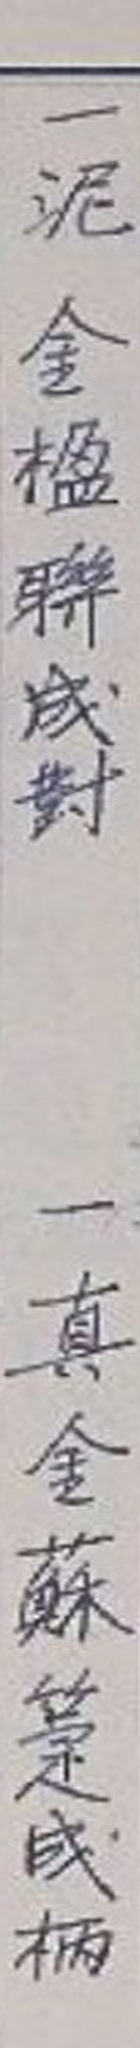一泥金楹聯成対一真金蘇箑成柄
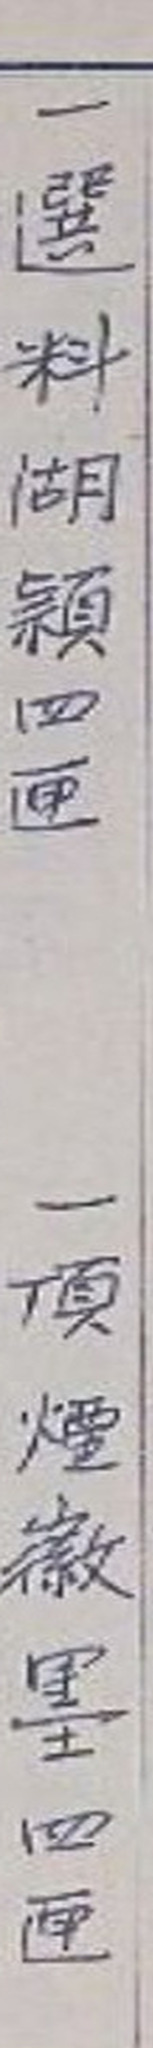一選料湖頴四匣一頂煙徽墨四匣
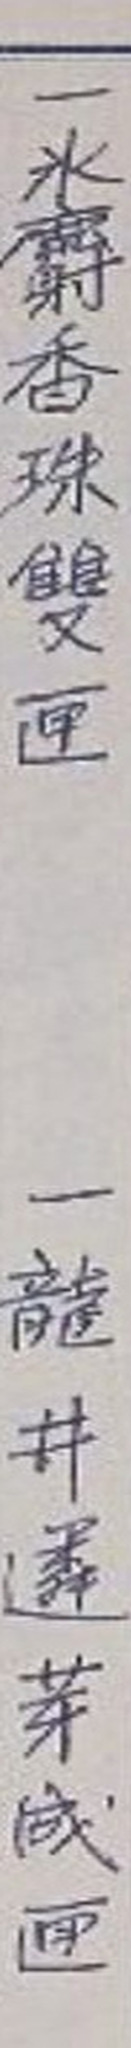一氷麝香玉雙匣一龍井遴芽成匣
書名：支那冊封使来琉諸記 下巻
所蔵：University of the Ryukyus Library
